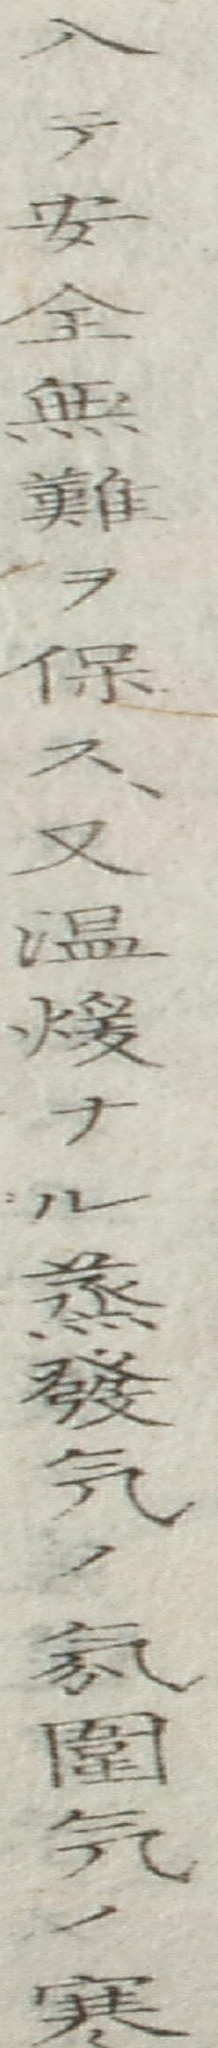入テ安全無難ヲ保ス、又温煖ナル蒸発気ノ雰囲気ノ寒
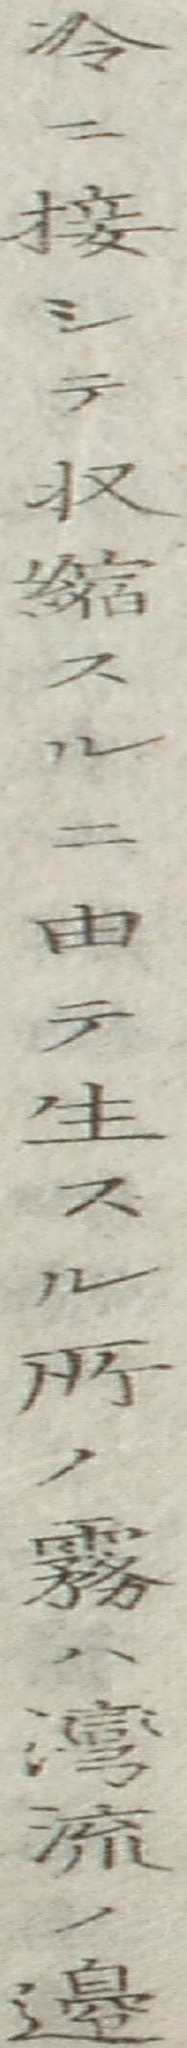冷ニ接シテ収縮スルニ由テ生スル所ノ霧ハ湾流ノ辺
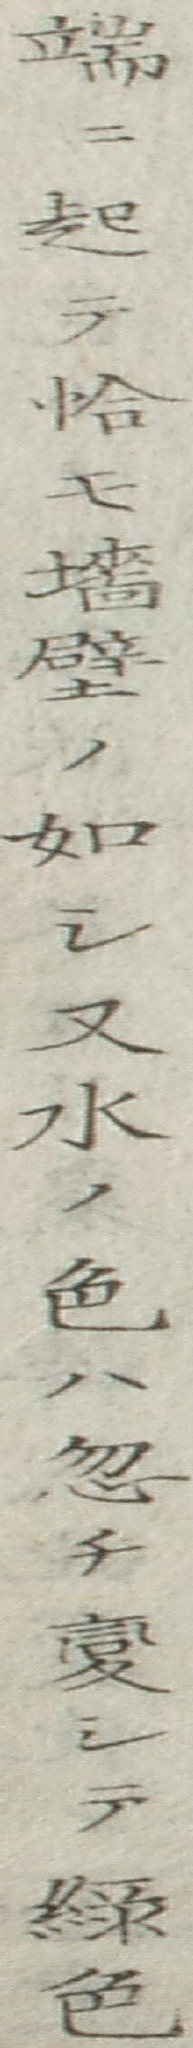端ニ起テ恰モ墻壁ノ如シ又水ノ色ハ忽チ変シテ緑色

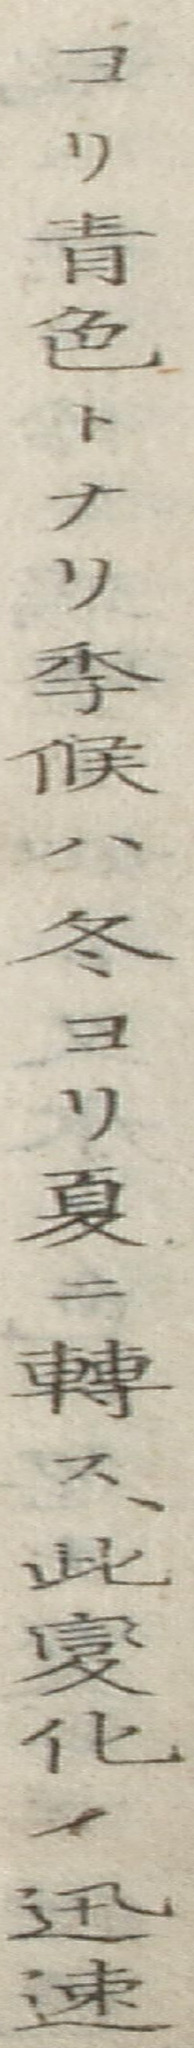ヨリ青色トナリ季候ハ冬ヨリ夏ニ転ス、此変化ノ迅速
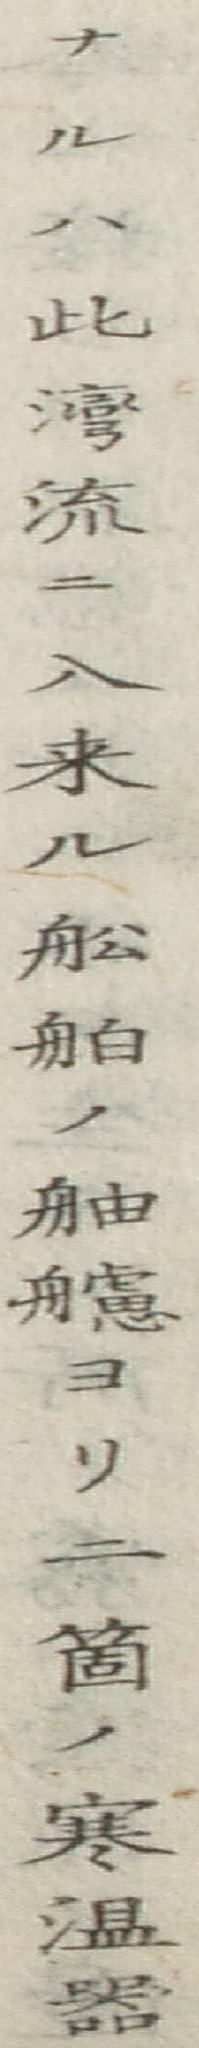ナルハ此湾流ニ入来ル船舶ノ舳艫ヨリ二箇ノ寒温器
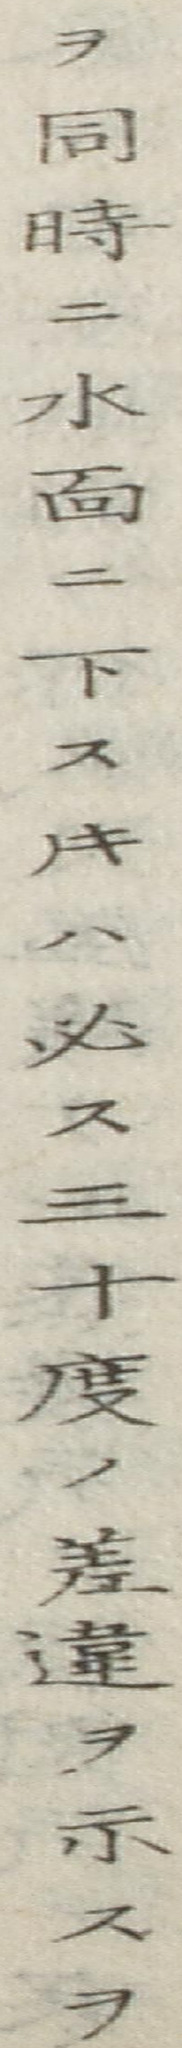ヲ同時ニ水面ニ下ストキハ必ス三十度ノ差違ヲ示スヲ
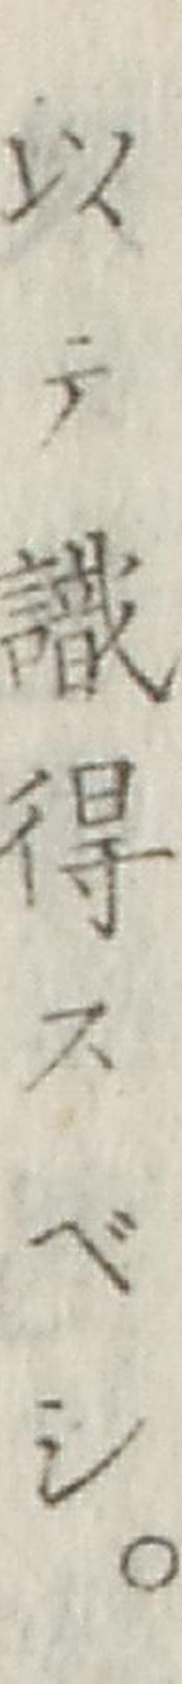以テ識得スベシ。
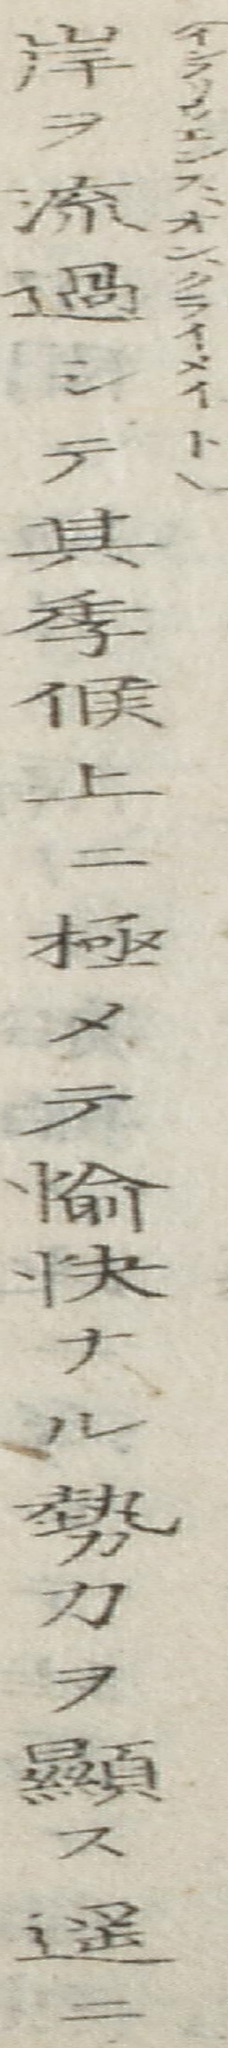岸ヲ流過シテ其季候上ニ極メテ愉快ナル勢力ヲ顕ス遥ニ
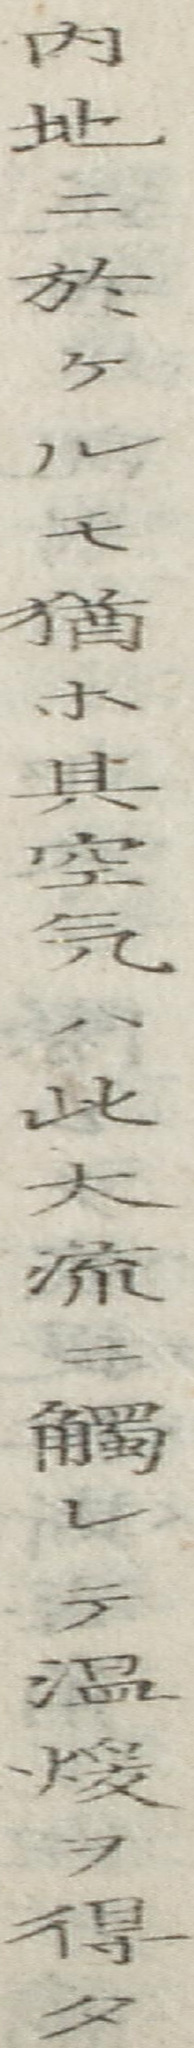内地ニ於ケルモ猶ホ其空気ハ此大流ニ触シテ温煖ヲ得タ
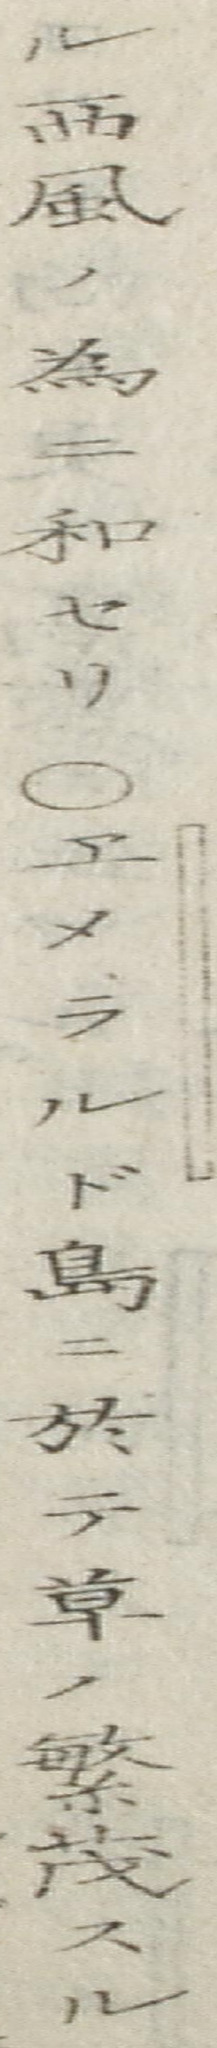ル西風ノ為ニ和セリ○ヱメラルド島ニ於テ草ノ繁茂スル
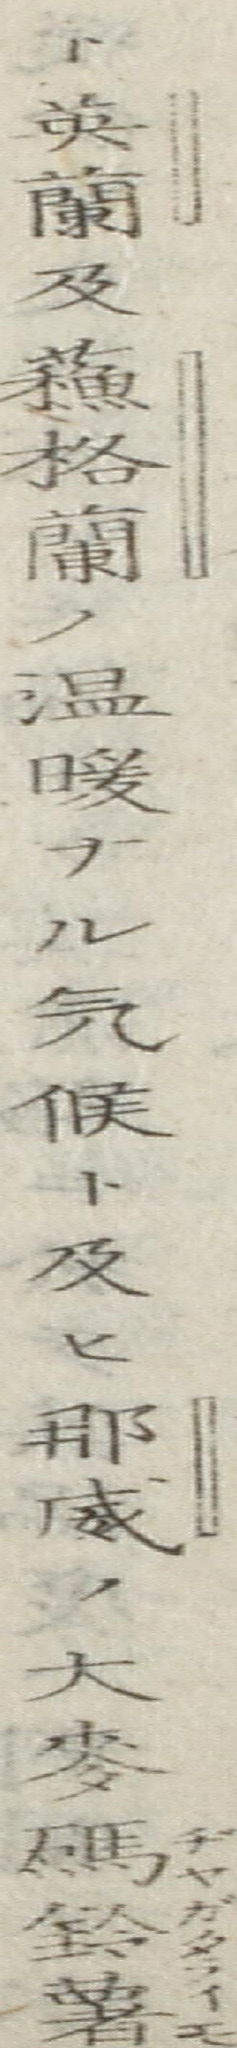ト英蘭及蘓格蘭ノ温暖ナル気候ト及ヒ那威ノ大麦馬鈴薯
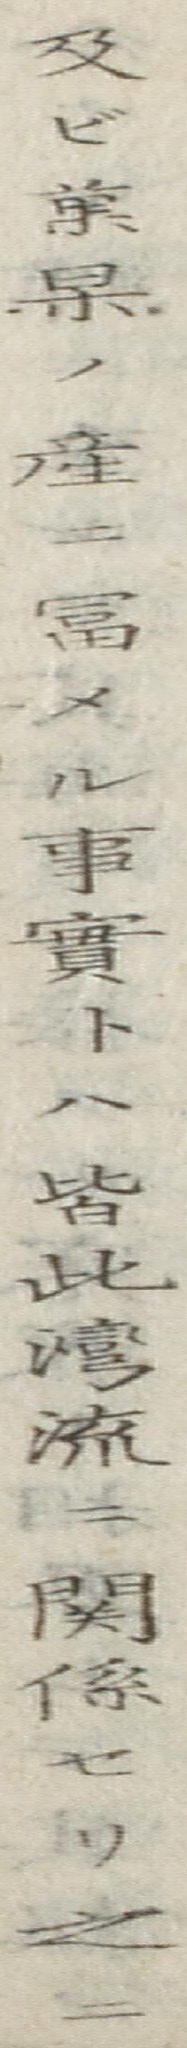及ビ菓杲ノ産ニ富メル事実トハ皆此湾流ニ関係セリ之ニ
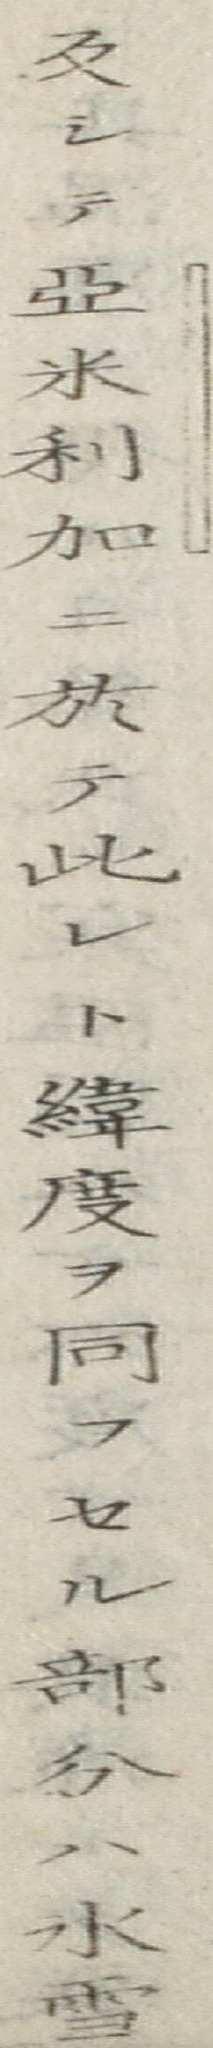反シテ亜米利加ニ於テ此レト緯度ヲ同フセル部分ハ氷雪
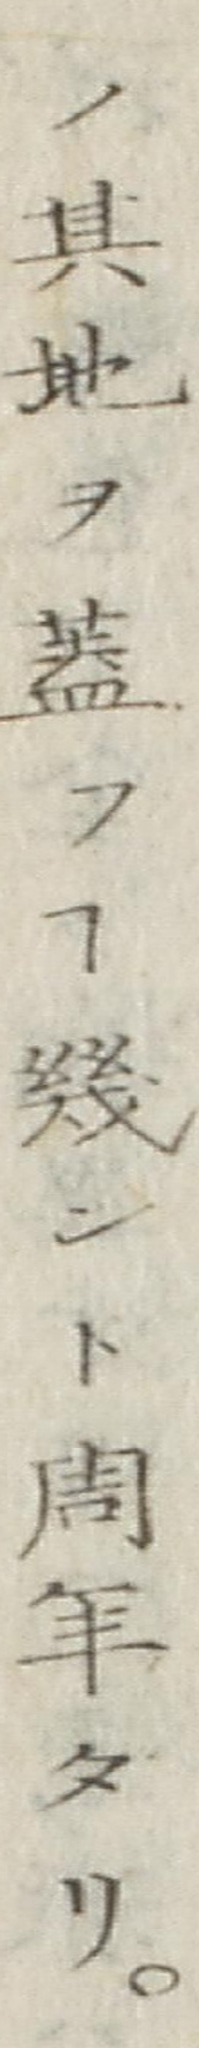ノ基地ヲ蓋フヿ幾ント周年タリ。
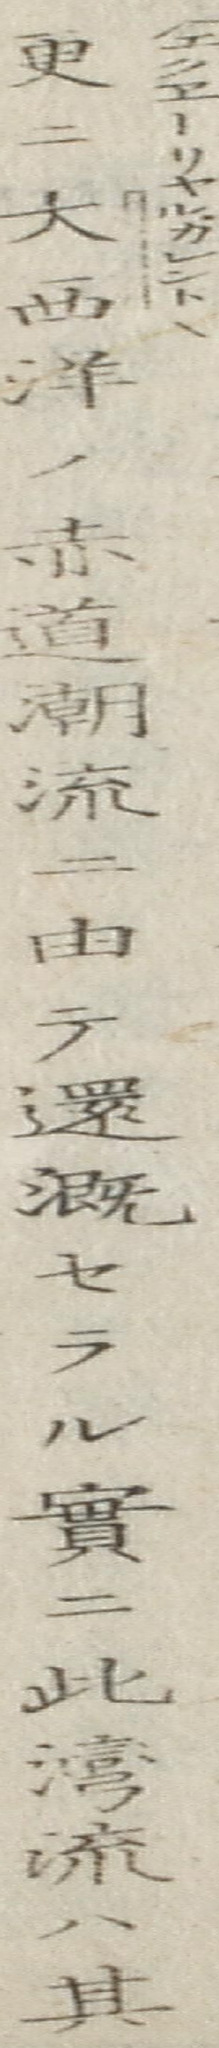更ニ大西洋ノ赤道潮流ニ由テ還漑セラル実ニ此湾流ハ其
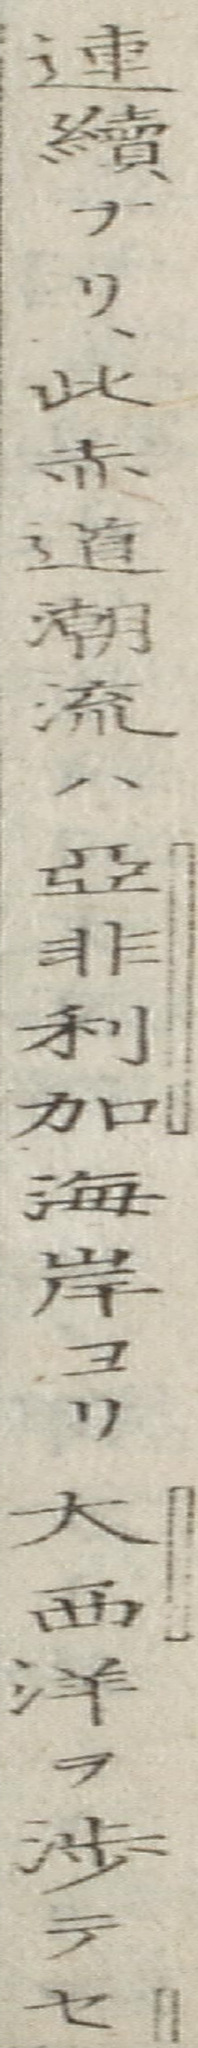連続ナリ、此赤道潮流ハ亜非利加海岸ヨリ大西洋ヲ渉テセ
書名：地形論　巻二
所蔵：東京大学地震研究所図書室 Earthquake Research Institute Library, The University of Tokyo, JAPAN
